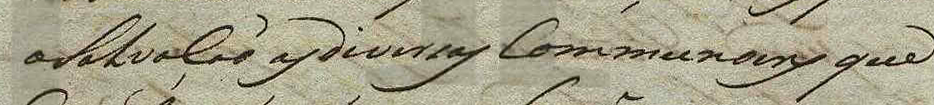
a SalvaÇaõ as diversas Communoens que
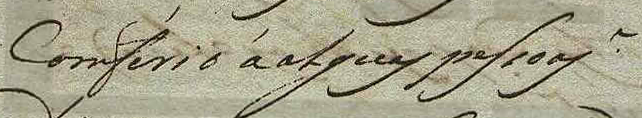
Comferio a alguas pessoas?
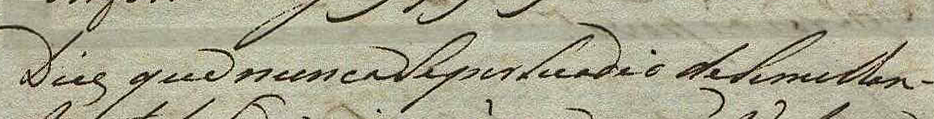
Dice que nunca Se persuadio de Semelhan
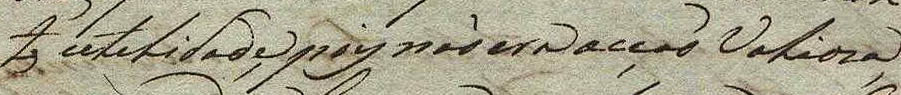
te utiLidade, pois naõ era acçaõ VaLioza
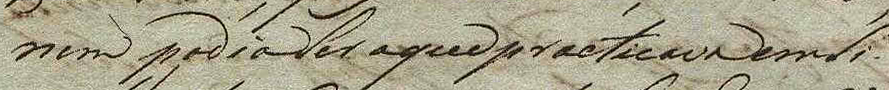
nem podia Ser a que practicava em Si
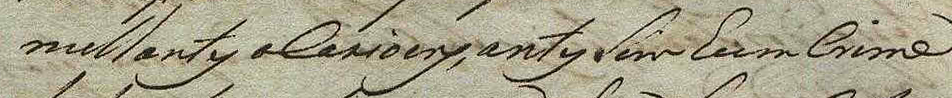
melhantes oCazioens, antes Sim hum Crime
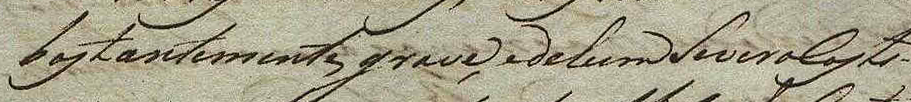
bastantemente grave, e de hum Severo Casti
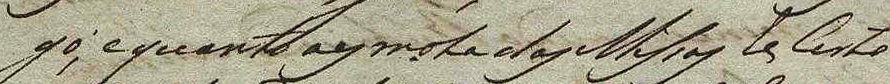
go, e quanto a esmola das Missas he Certo
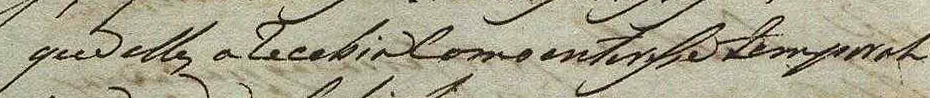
que elle a Recebia Como interesse temporaL
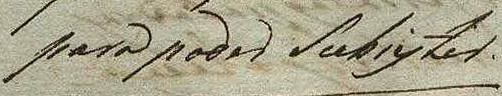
para poder subsistir.
